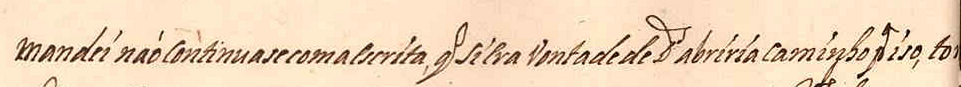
mandei naõ continuase com a escrita, q̄ se era vontade de Ds abriria caminho pa iso, tor
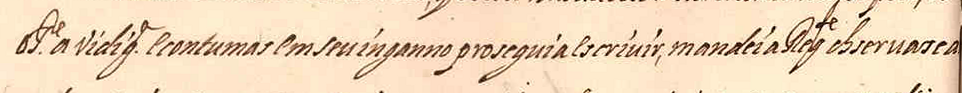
o P.e a vidig.a e contumas em seu inganno proseguia escriuir, mandei a Regte obseruase a
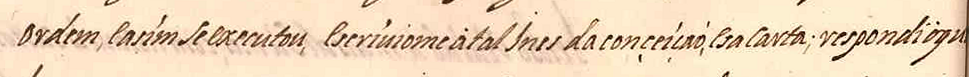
ordem, e asim se executou, escriuiome a tal Ines da conceiçaõ esa carta, respondi o que
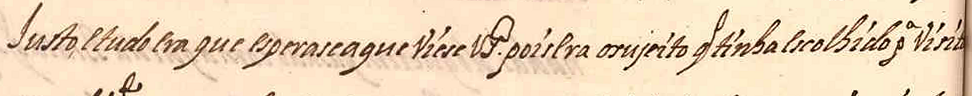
Iusto, e tudo era que esperase a que viese vP. pois era o sujeito q̄ tinha escolhido p.a visit
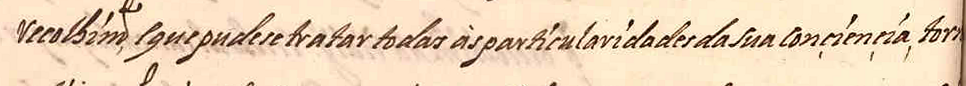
recolhimto, e que pudese tratar todas as particularidades da sua conciencia, torn
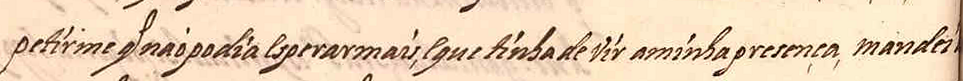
petirme q̄ naõ podia esperar mais, e que tinha de vir a minha presença, mandei
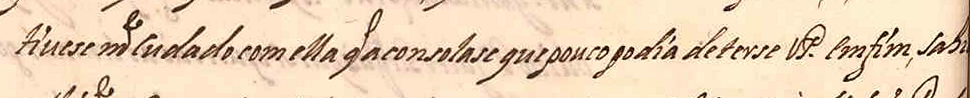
tiuese mto cudado com ella q̄ a consolase que pouco podia deterse vP. emfim, sahi
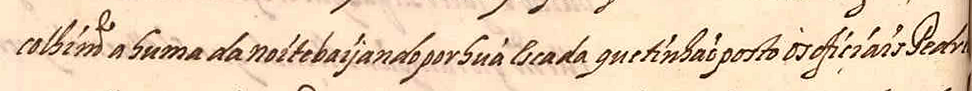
colhimto a huma da noite baijando por huā escada que tinhaõ posto os oficiaes Pedro
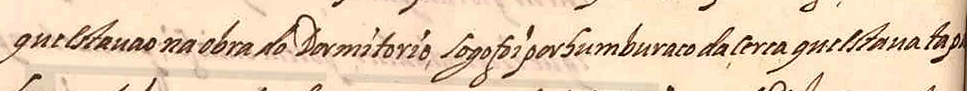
que estauao na obra do Dormitorio, logo foi por hum buraco da cerca que estaua tap
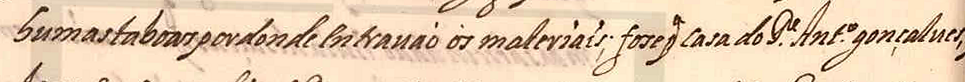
humas taboas por donde entrauaõ os materiais; fose pa casa do P.e Anto gonçalues,
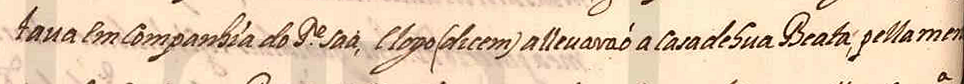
taua em companhia do P.e saa, E logo (decem) a lleuaraõ a casa de hua Beata, pella men
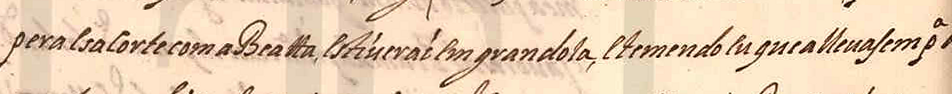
pera esa corte com a Beatta, estiueraõ em grandola, e temendo eu que a lleuasem pa
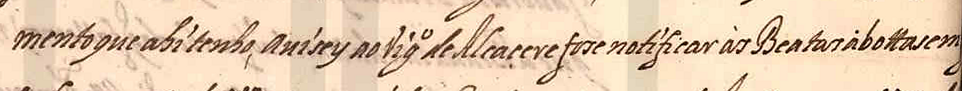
mento que ahi tenho, auisey ao Vigo de Alcacere fose notificar às Beatas a bottasem
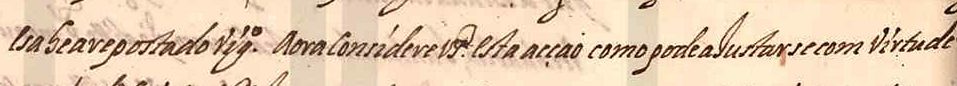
esa he a reposta do Vig.o Aora considere vP. esta acçaõ como pode aIustarse com virtude
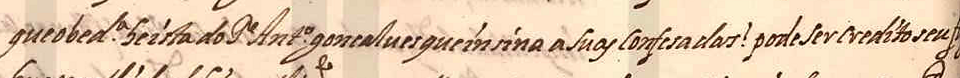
que obed.a he ista do P.e Ant.o gonçalues que insina a suas confesadas? pode ser credito seu
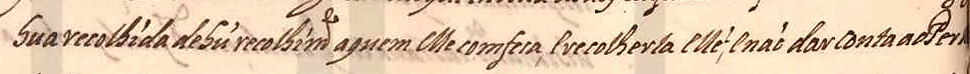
hua recolhida de hū recolhimto a quem elle comfesa, E recolherla elle? e naõ dar conta ao Per
